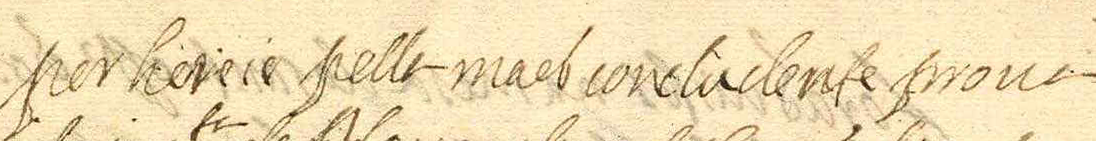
por hereie pella maes concludente proua
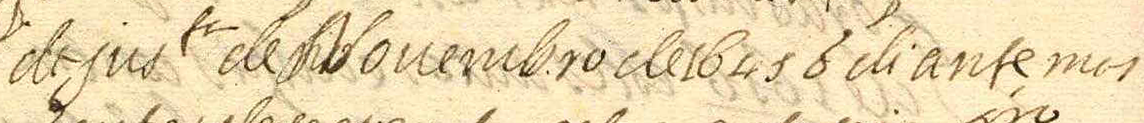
da justa de Nouembro de 1645 ē diante mas
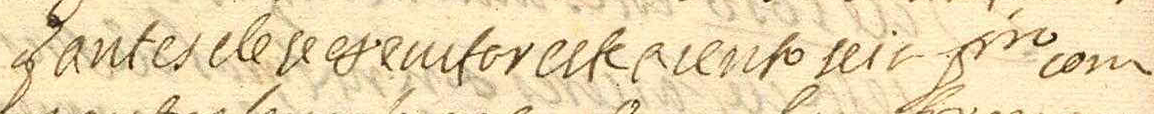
q̄ antes de se esecutar este acento seia pro com
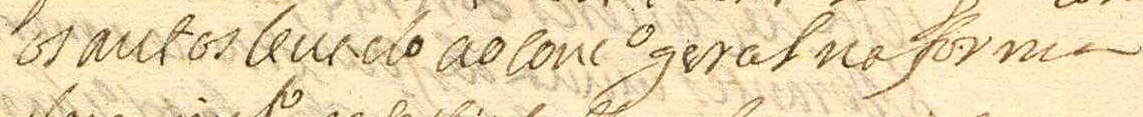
os autos leuado ao conco geral na forma
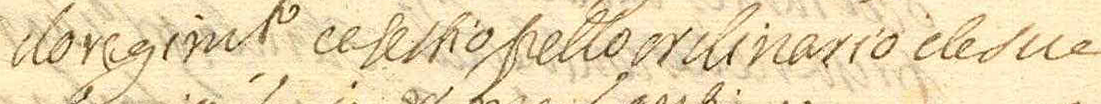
do regimto e asestio pello ordinario de sua
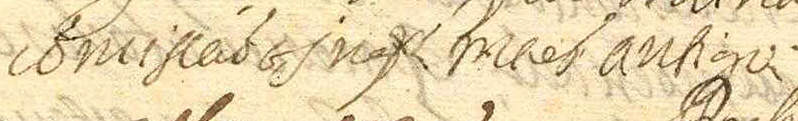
comissaõ o inq.r maes antigo
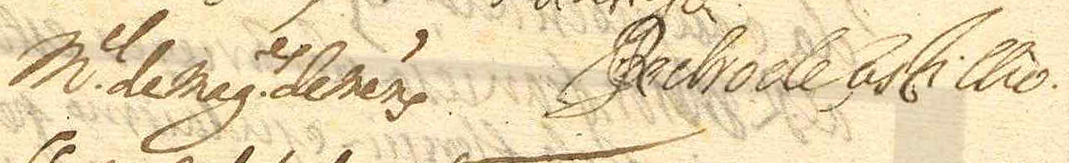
M.el de Mag.es de men̄s Pedro de Castilho.
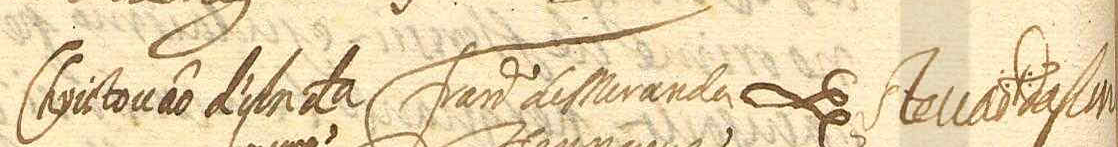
Christouão d'And̄a Franco de Miranda Esteuaõ da Cun
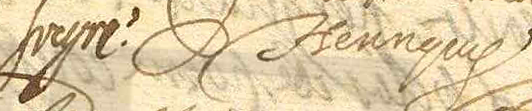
freyre. Henriques
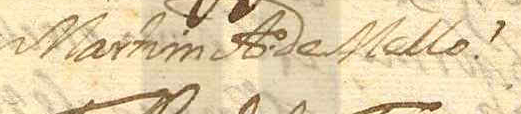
Martim A.o de Melo.
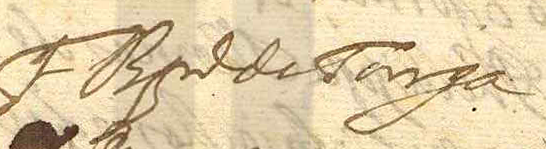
F Bpō de Targa
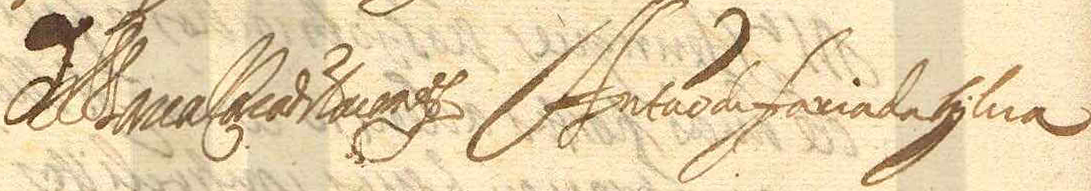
Marçal Cazado Iacome Antão de faria da Sylua
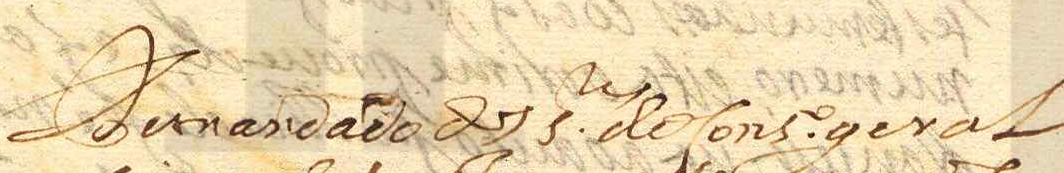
Demandado dos S.res do Cons.o geral
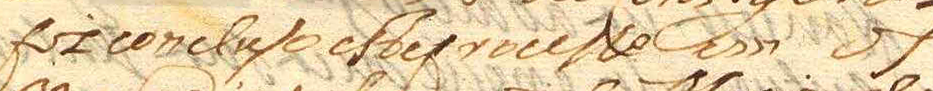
fiz concluso este processo em os
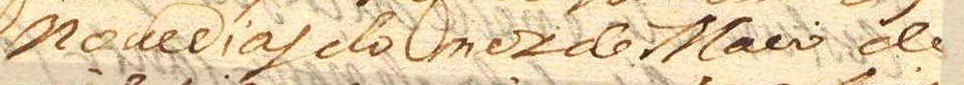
noue dias do mez de Maio de
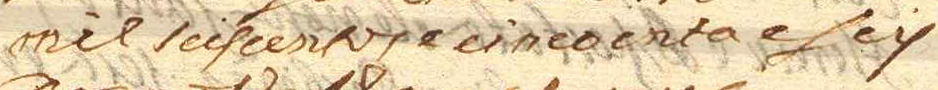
mil seiscentos e cincoenta e seis
